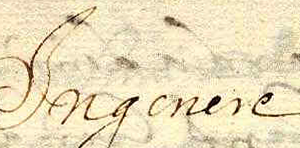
In genere
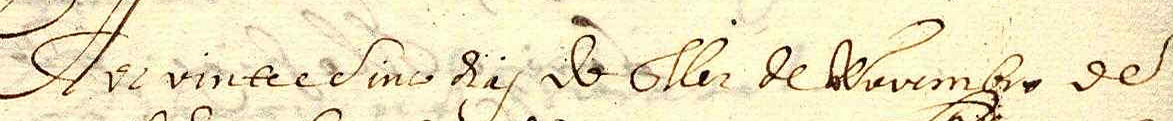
Aos vinte e sinco dias do Mez de Novembro de
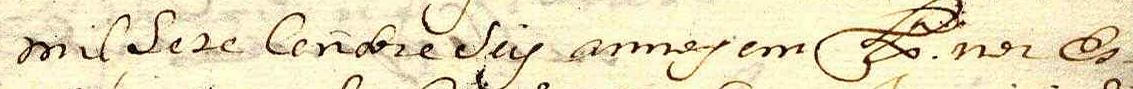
mil, SeteCentos e seis annos em Lx.a nos Es
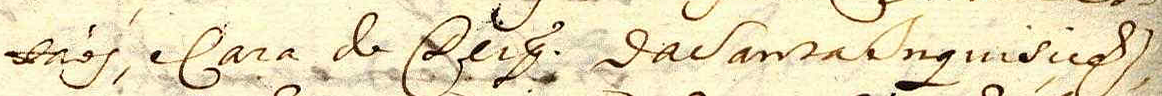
taós, e Caza do Desp.o da Santa Inquisiçaõ,
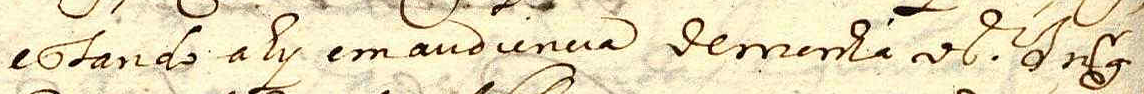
estando ahy em audiencia de menhã o S.or Inqr
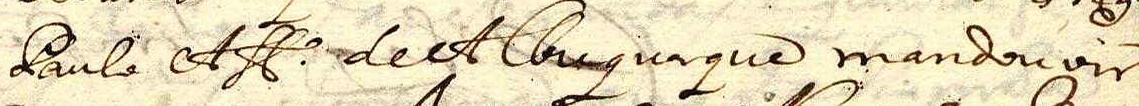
Paulo Aff.o de Albuquerque, mandou vir
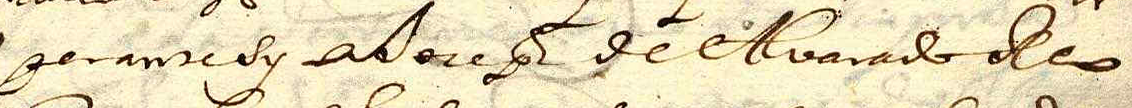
perante sy a Iozeph de Alvarado Reo
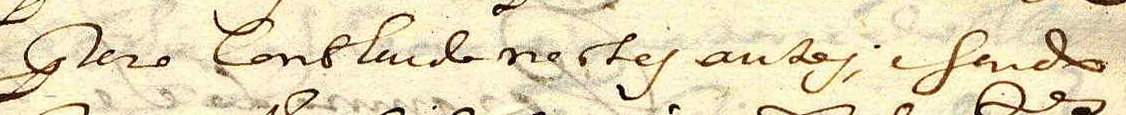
pRezo Contheudo nestes autos, e sendo
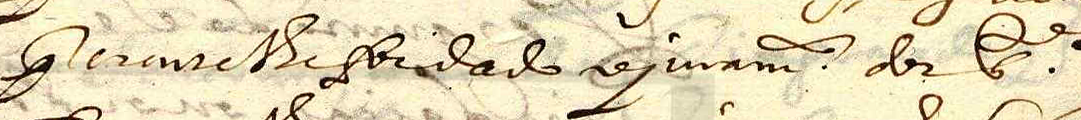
pRezente lhe foi dado o juram.to. dos s.tos
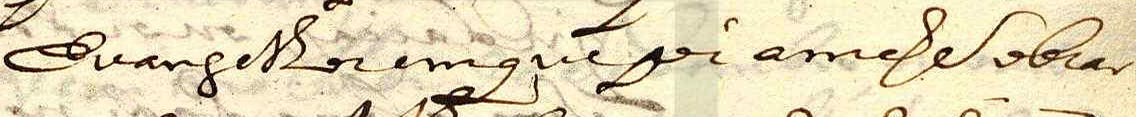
Evangelhos em que poz a maõ Sob car
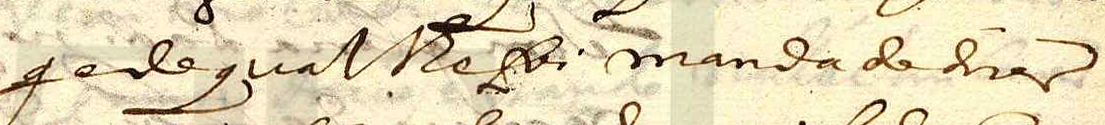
go do qual lhe foi mandado dizer
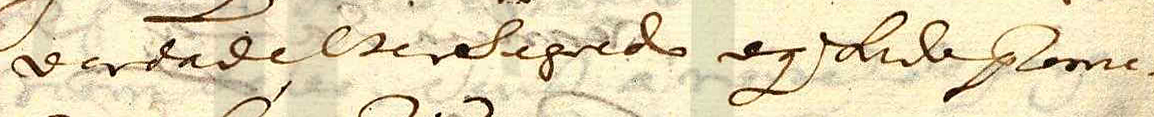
verdade e ter segredo o q̄ Lido pRome
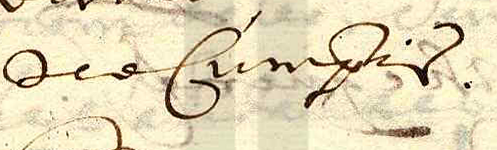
teo Cumprir.
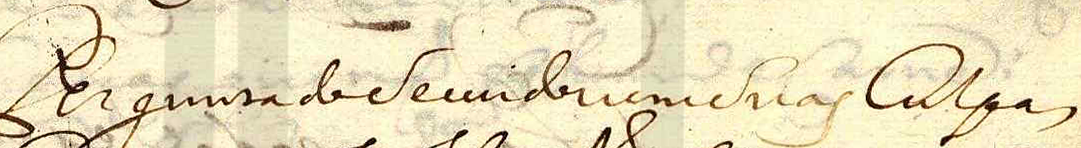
Perguntado se cuidou em Suas Culpas
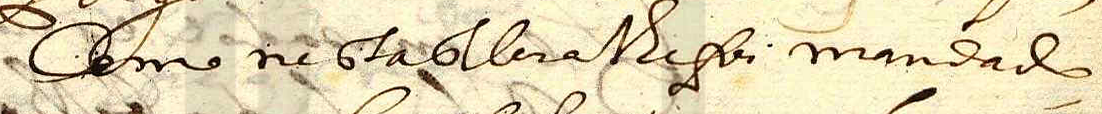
Como nesta Meza lhe foi mandado
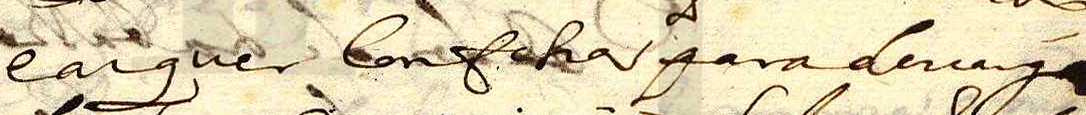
e as quer Confessar para descargo
